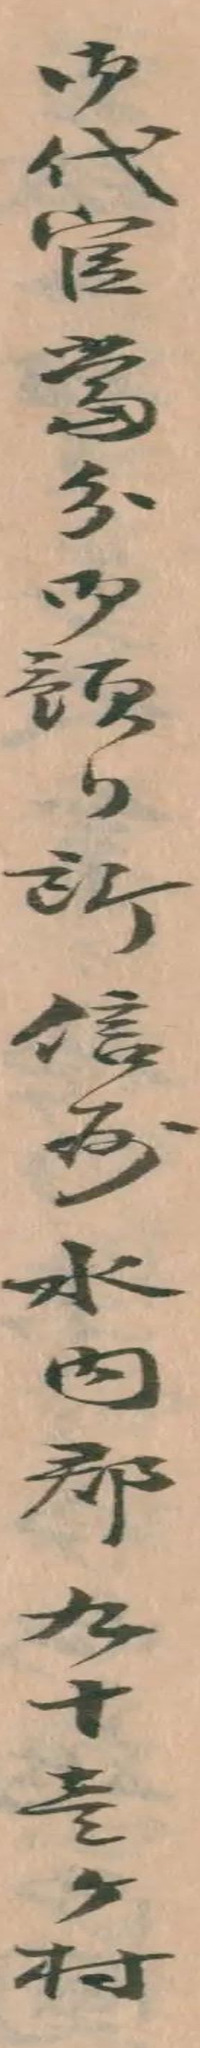御代官所当分御預り所信州水内郡九十壱ヶ村
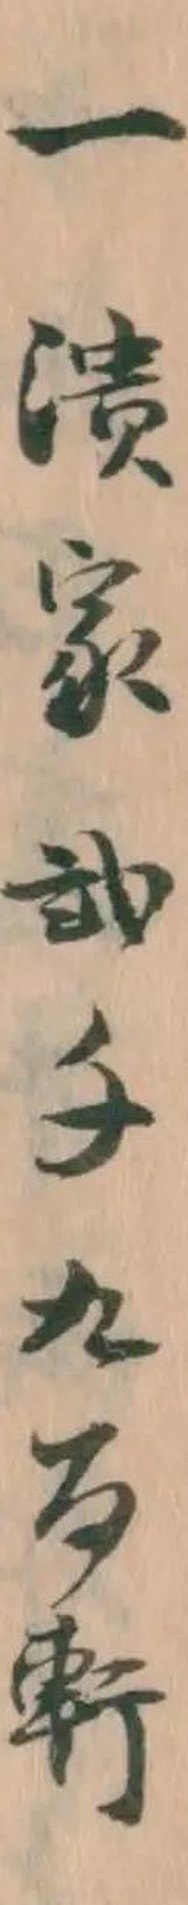一潰家弐千九百軒
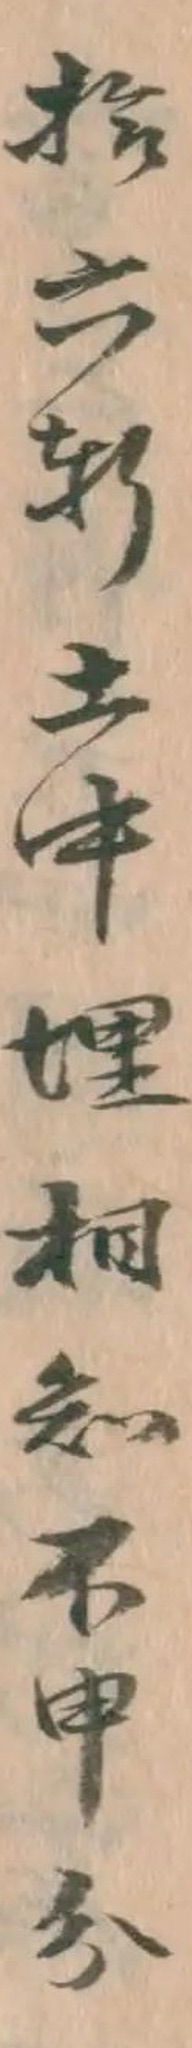拾六軒土中埋相知不申分
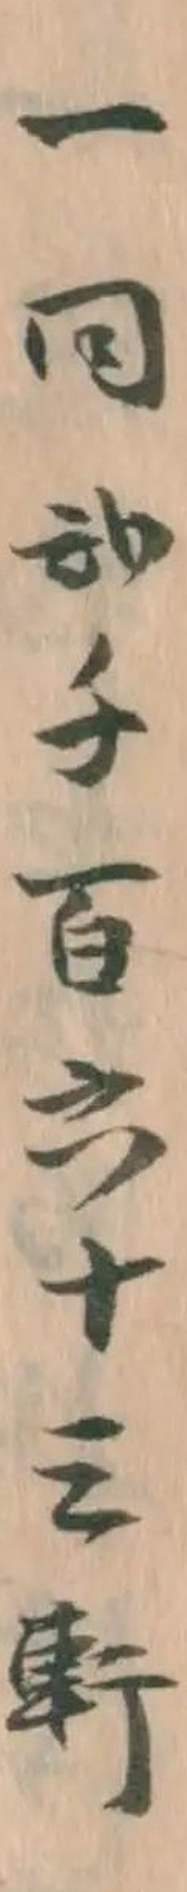一同弐千百六十三軒
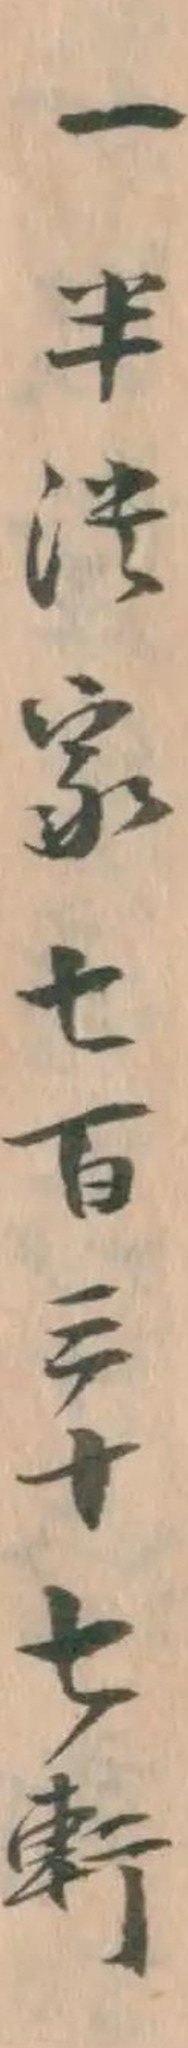一半潰家七百三十七軒
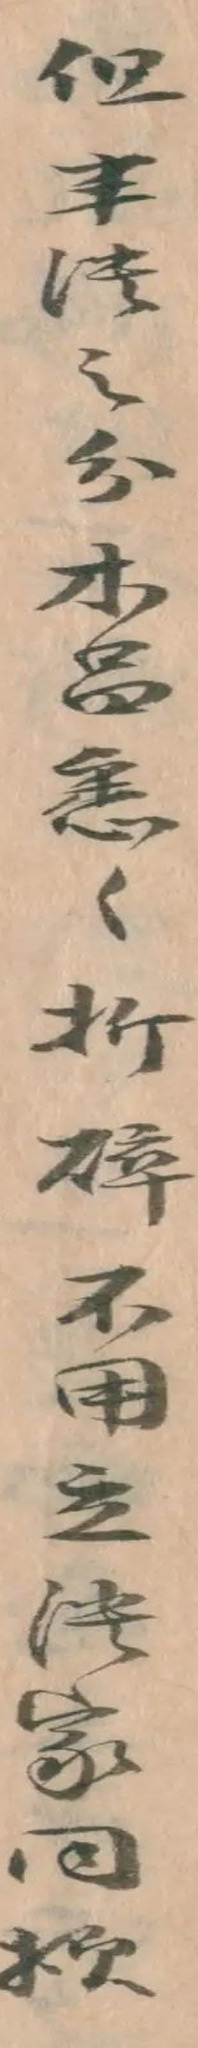但半潰之分木品悉く折砕不用立潰家同様

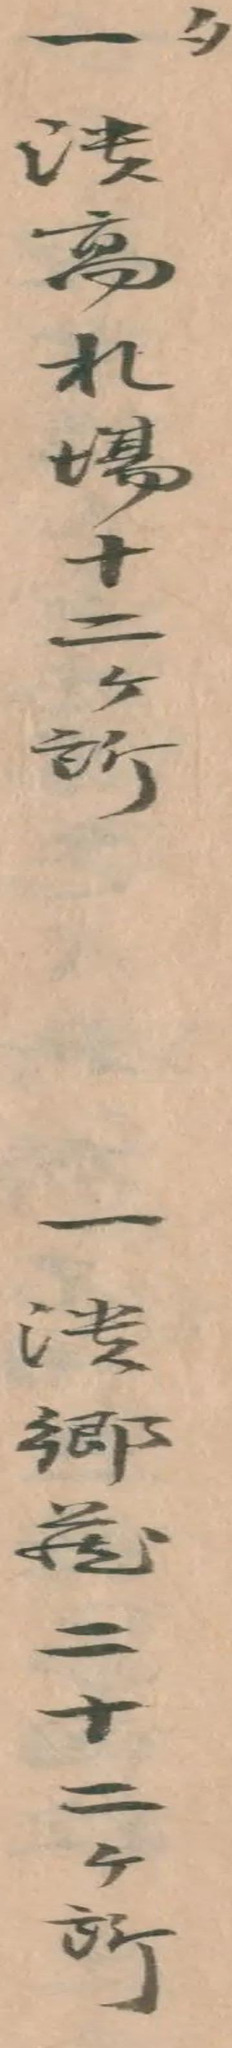一潰高札場十二ケ所一潰郷蔵二十二ケ所
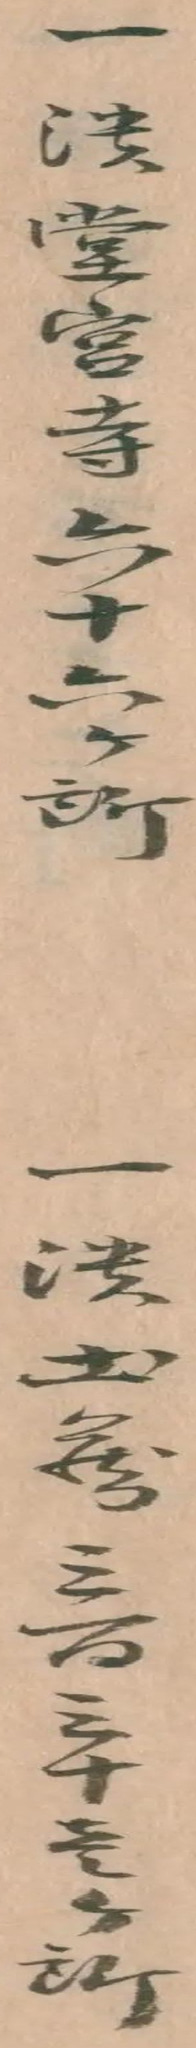一潰堂宮寺潰六十六ケ所一潰土蔵三百三十壱ケ所
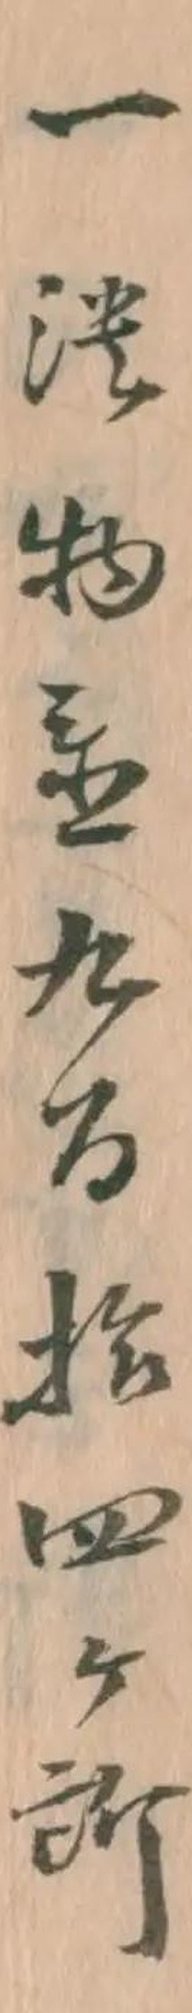一潰物置九百拾四ケ所
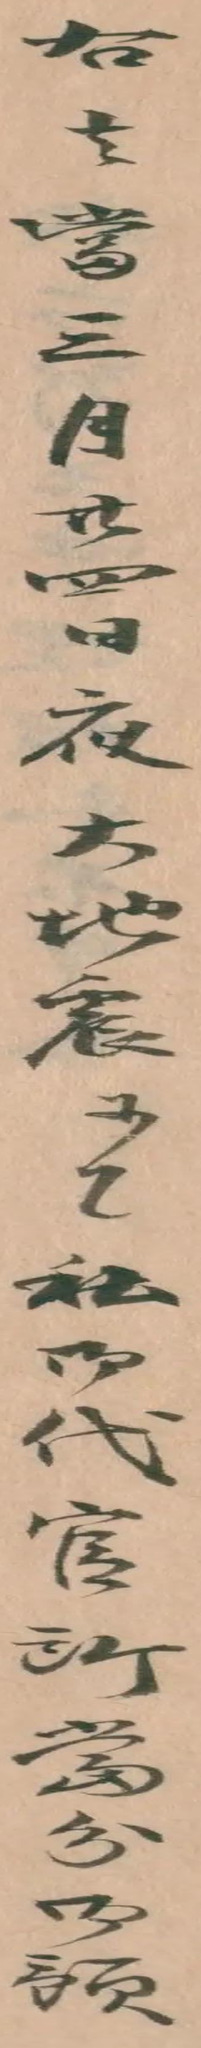右者当三月廿四日夜大地震にて私御代官所当分御預
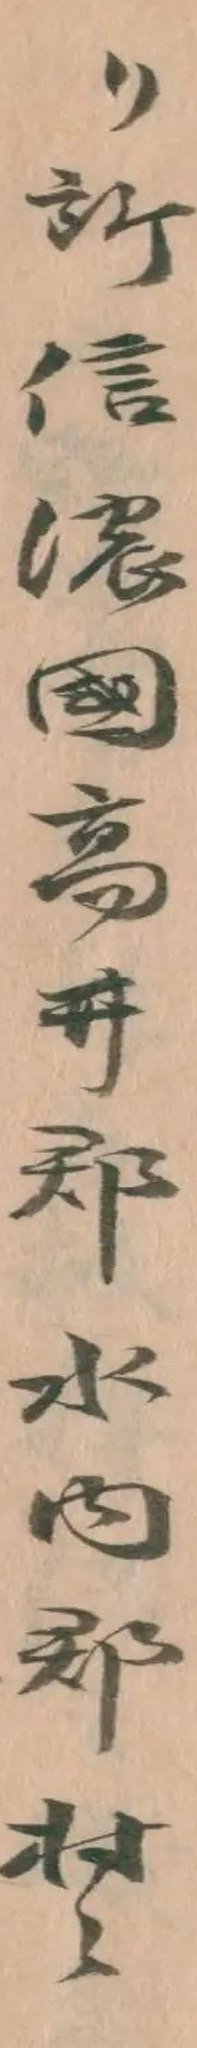り所信濃国髙井郡水内郡村々
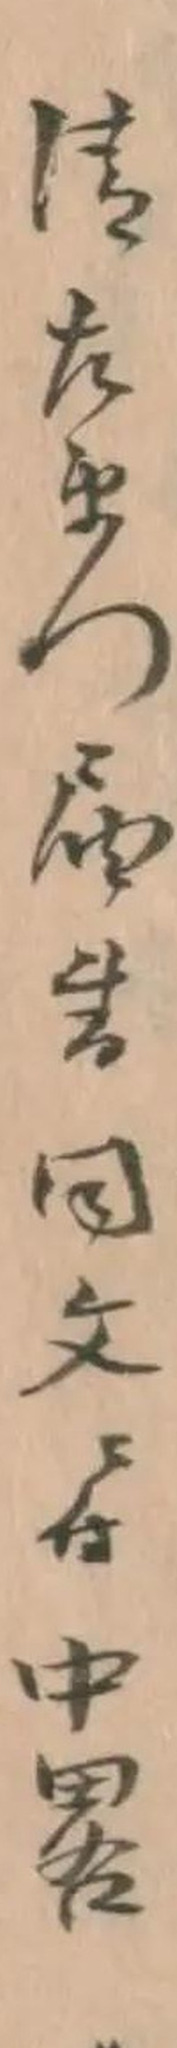清左衛門届書同文二付中略就
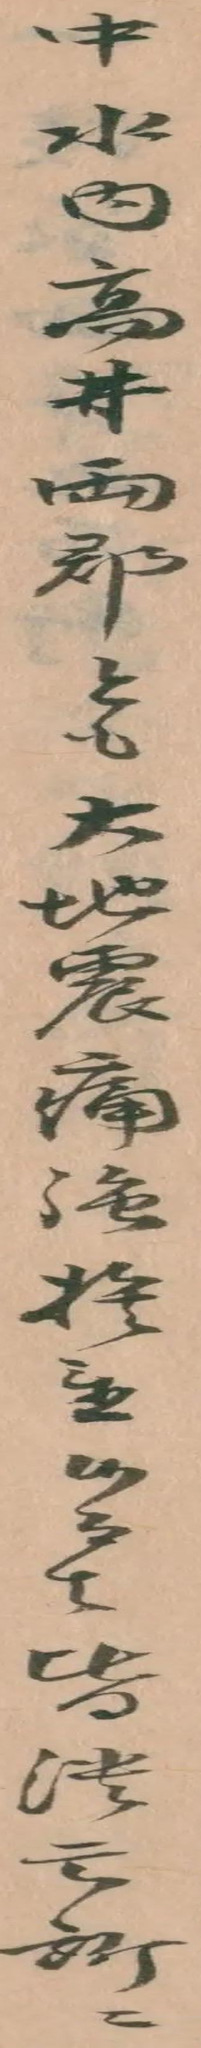中水内高井両郡とも大地震痛強捨置候而者皆潰亡所ニ
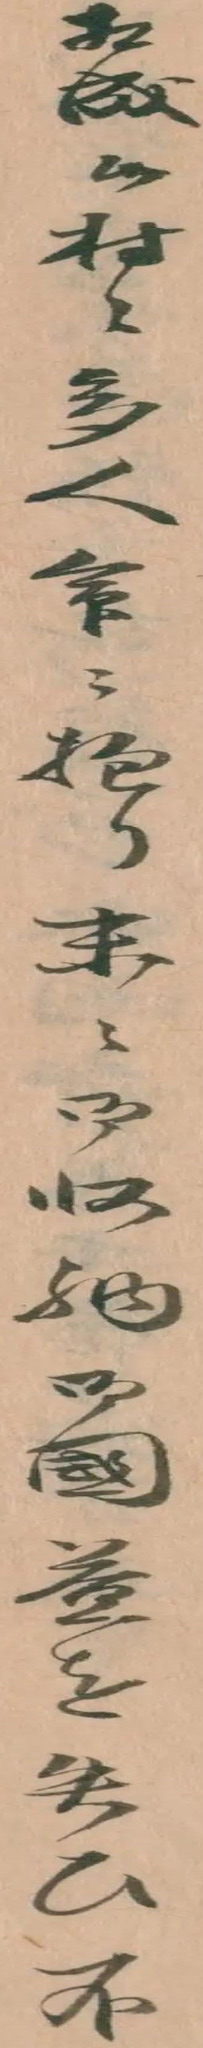相成候村々多人命ニ拘り末々御収納御国益を失ひ不
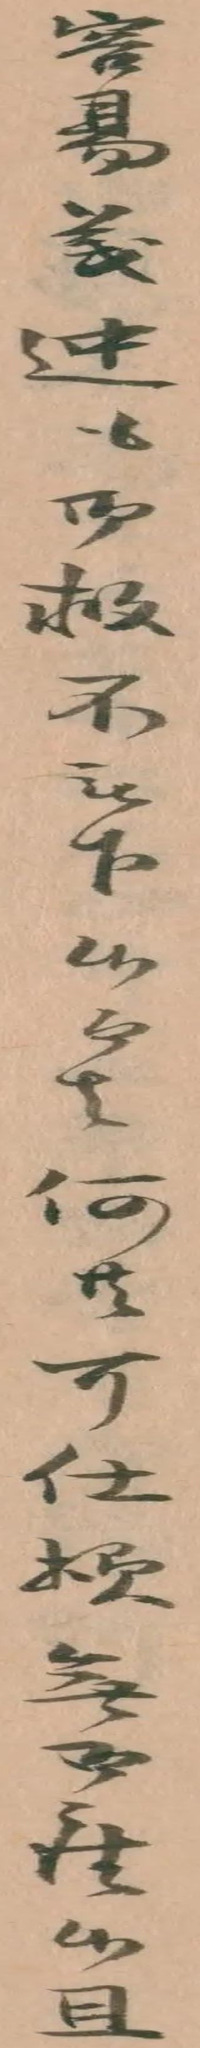容易儀迚も御救不被下置候而者何共可仕様無御座候且
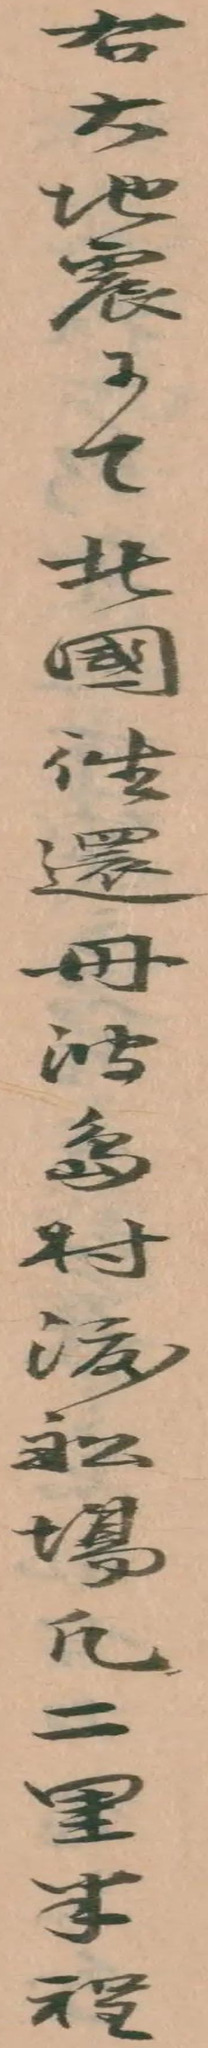右大地震にて北国往還丹波島村渡船場凡弐里半程
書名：地災撮要. 巻3(地震之部)-巻4(噴火之部)
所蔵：国立国会図書館 National Diet Library, JAPAN
